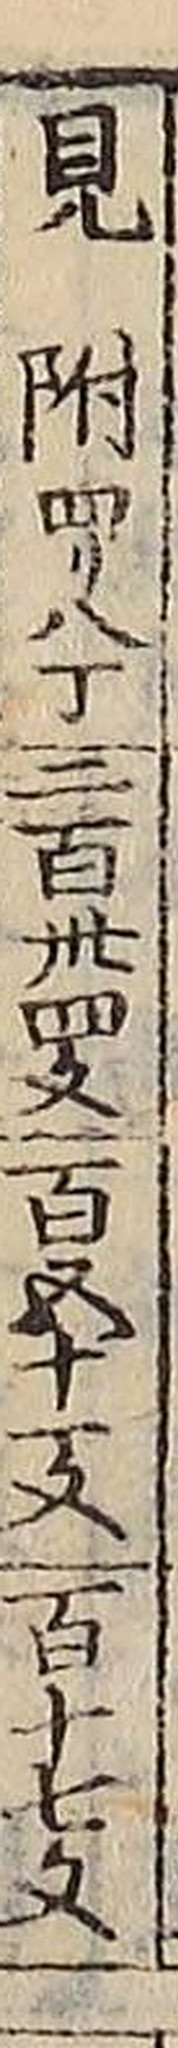見附四リ八丁二百卅四文百五十一文百十七文
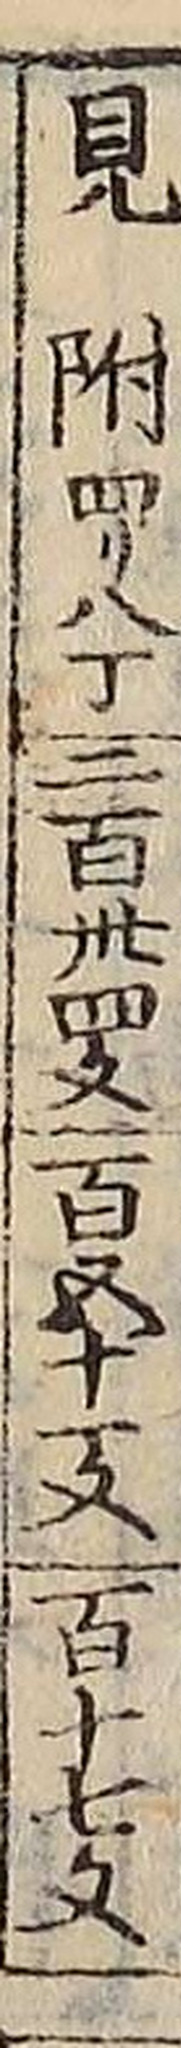見附四リ八丁二百卅四文百五十一文百十七文
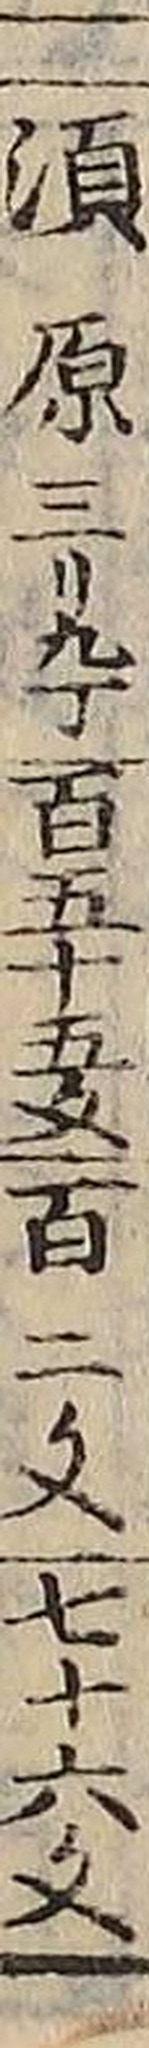須原三リ九丁百五十五文百二文七十六文
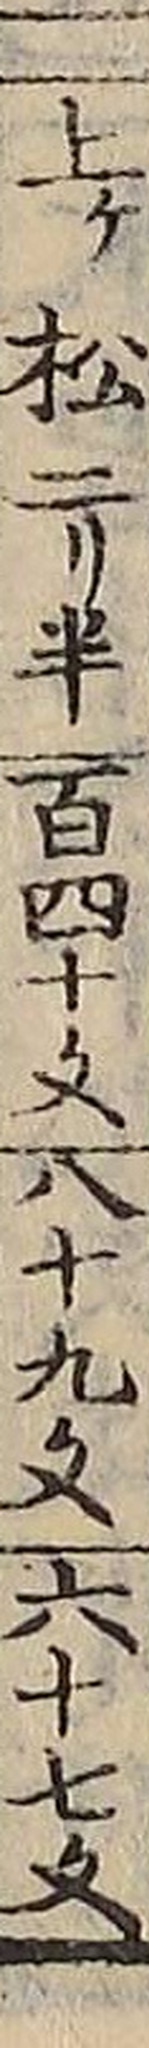上松二リ半百四十文八十九文六十七文
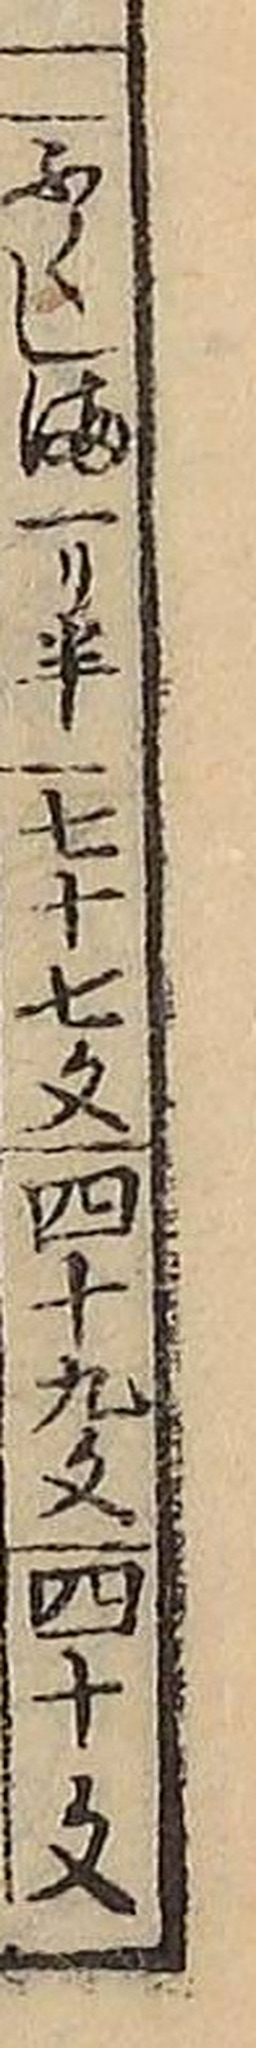ふくしま一リ半七十七文四十九文四十文
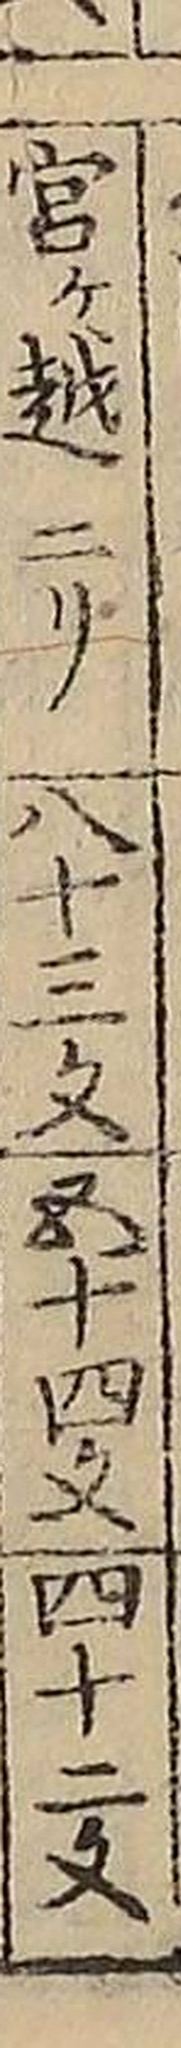宮越二リ八十三文五十四文四十二文
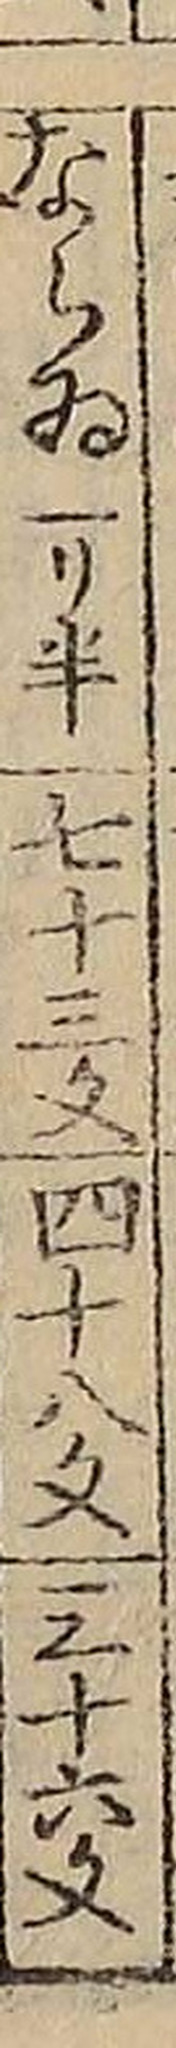ならゐ一リ半七十三文四十八文三十六文
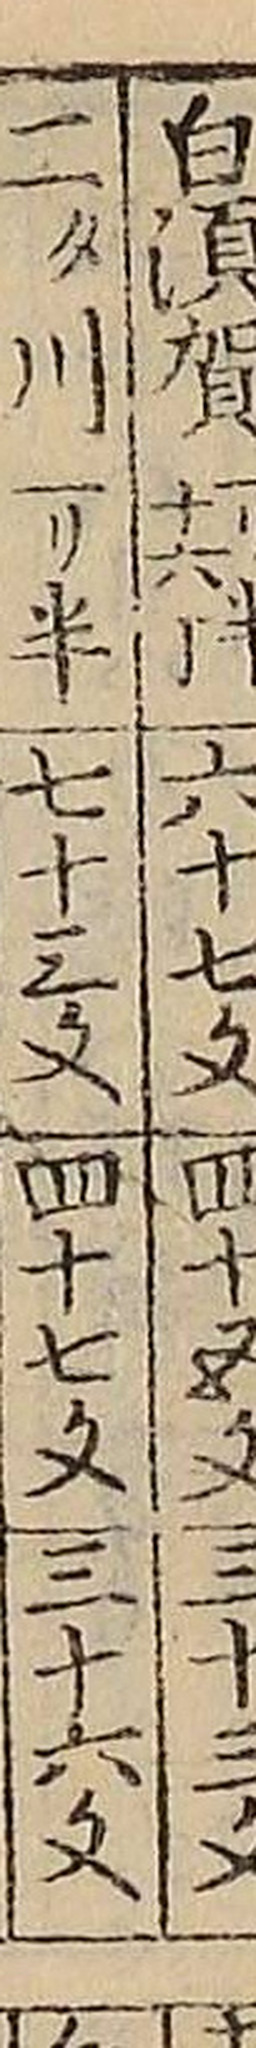二川一リ半七十三文四十七文三十六文
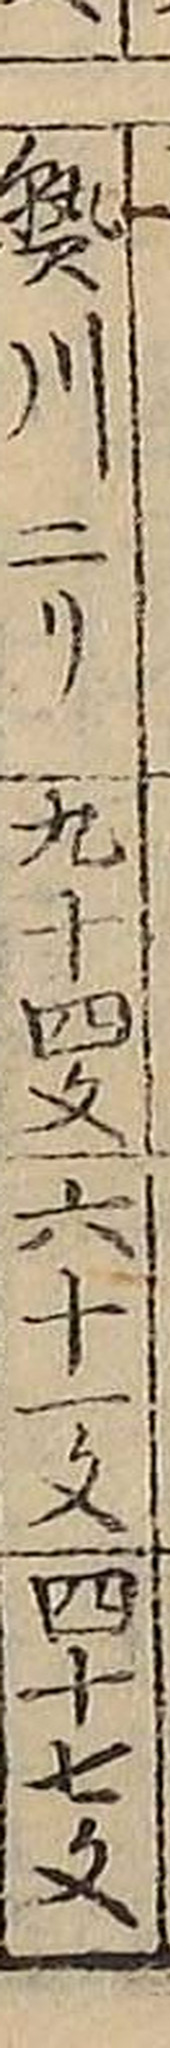贄川二リ九十四文六十一文四十七文
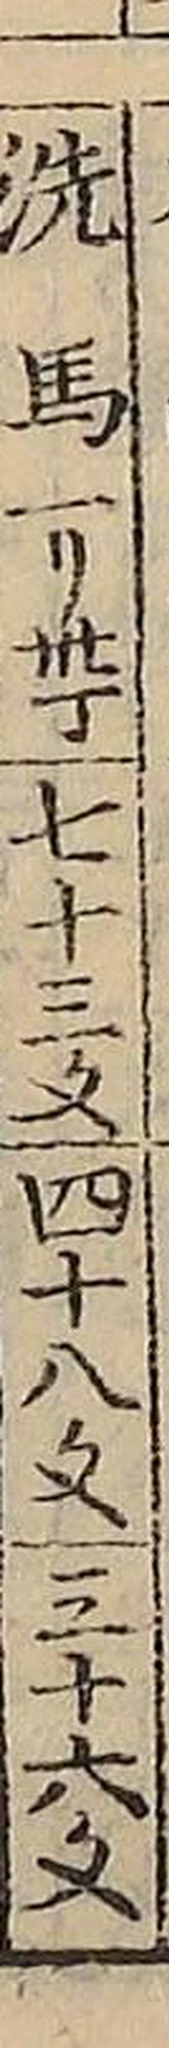洗馬一リ卅丁七十三文四十八文三十六文
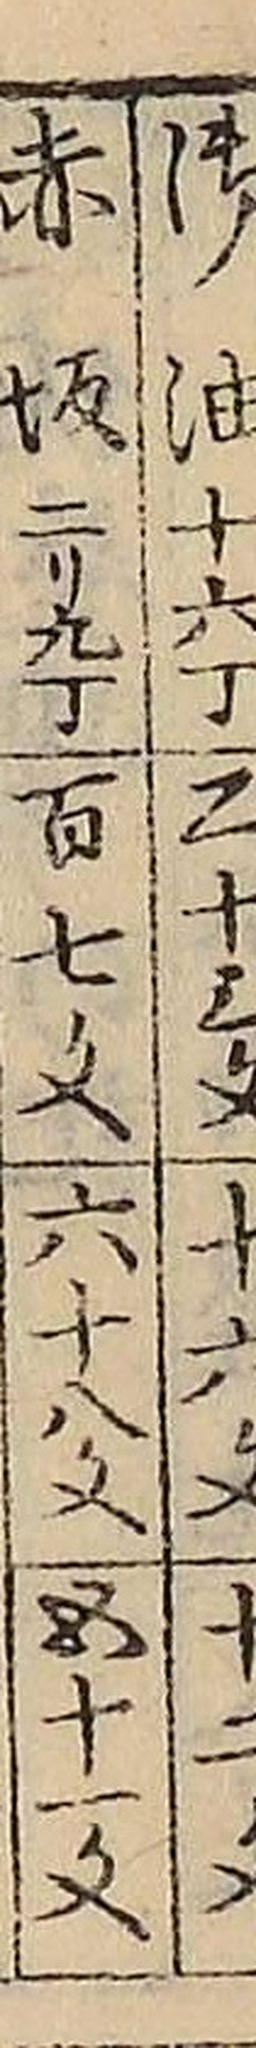赤坂二リ九丁百七文六十八文五十一文
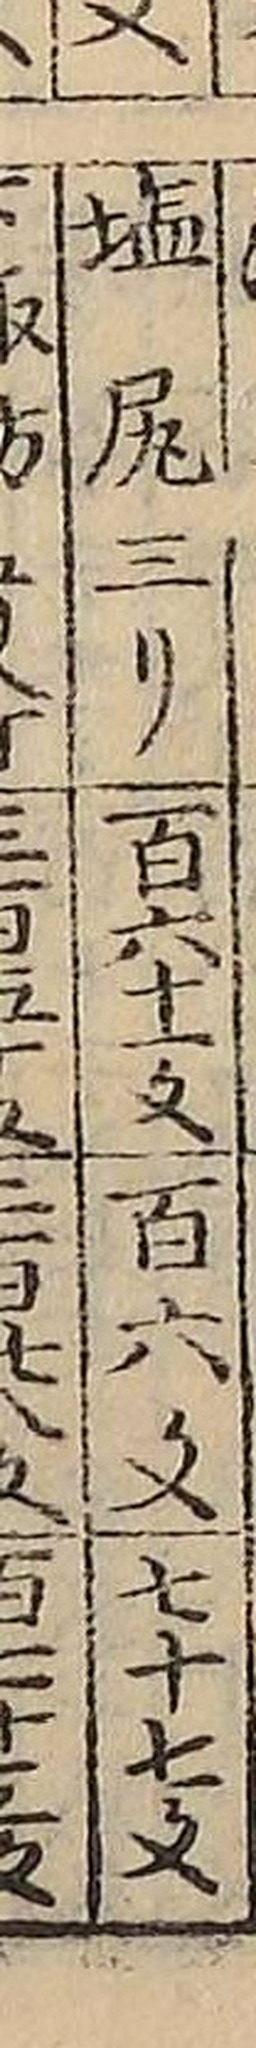下詠訪五リ八丁三百五十文二百廿八文百七十三文
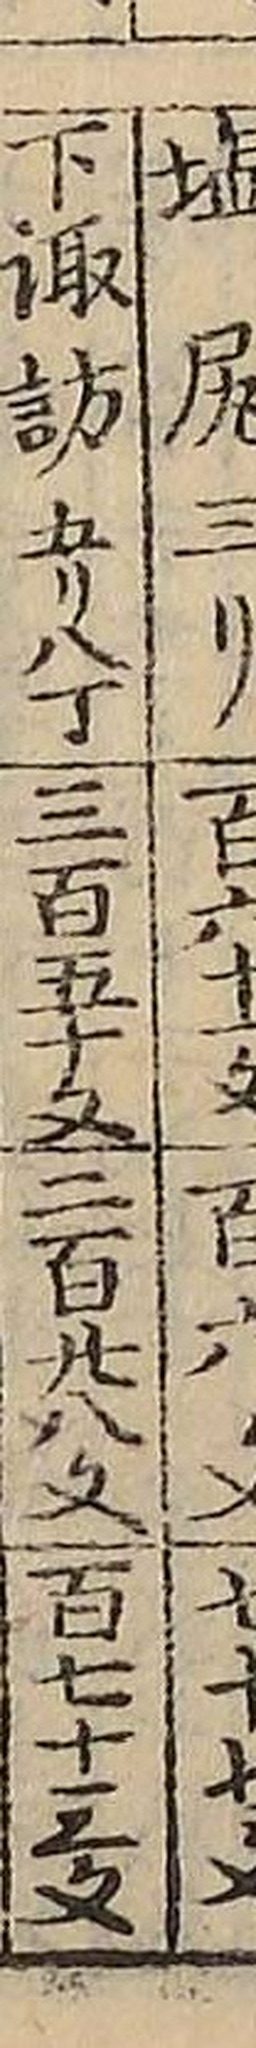下詠訪五リ八丁三百五十文二百廿八文百七十三文
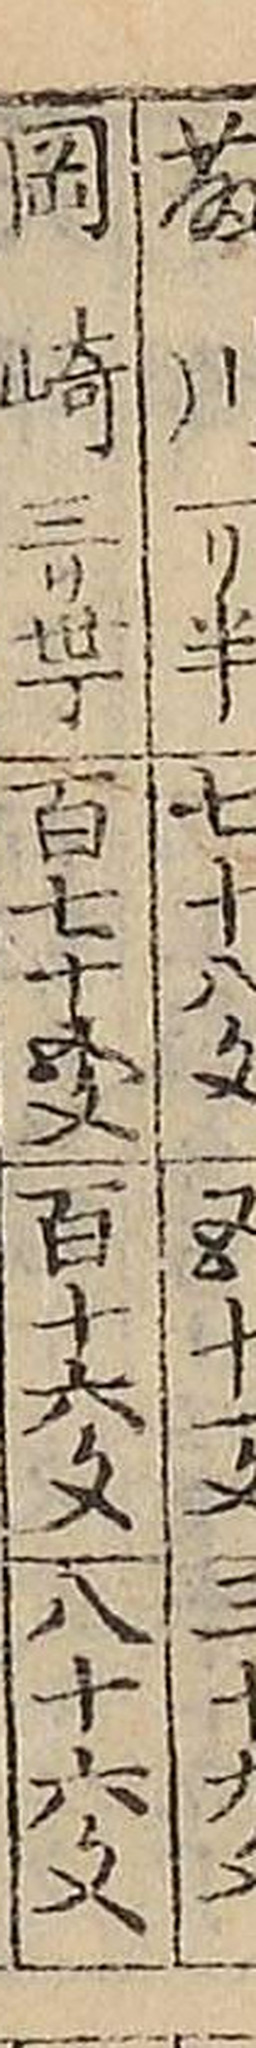岡崎三リ卅丁百七十五文百十六文八十六文
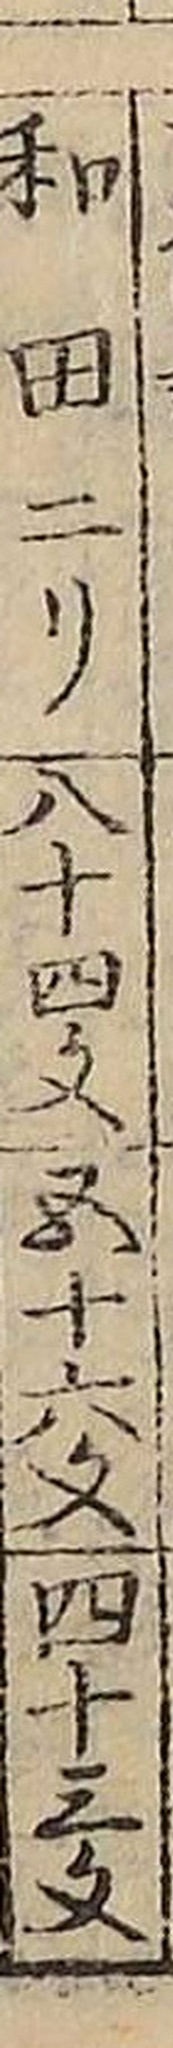和田二リ八十四文五十六文四十三文
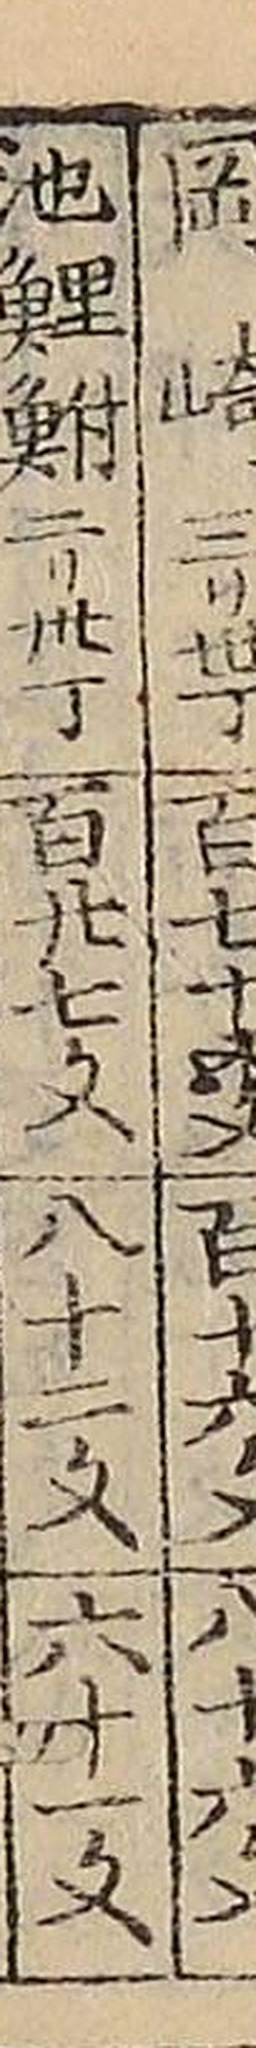池鯉鮒二リ卅丁百廿七文八十二文六十一文
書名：旅行用心集
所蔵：神戸大学附属図書館 国文学研究資料館
